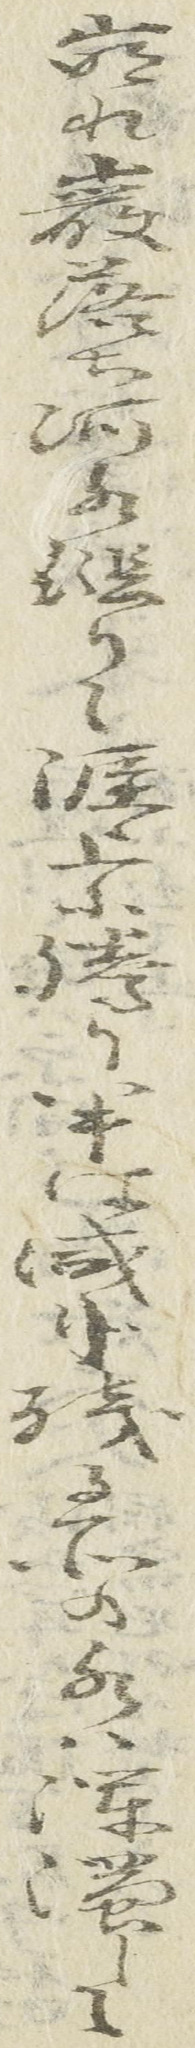崩れ巌落ち河水漲りて涯上に騰り半は咸り残る所の水は深濁して
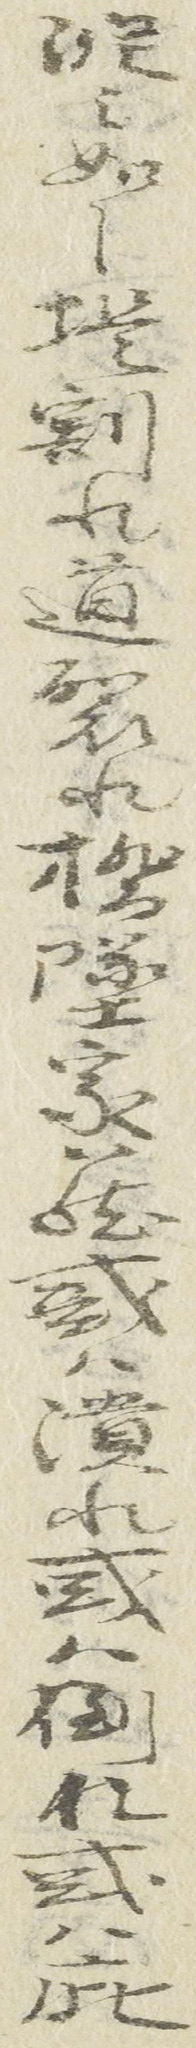泥之如し堤割れ道裂れ橋墜家蔵或は潰れ或は倒れ或は庇
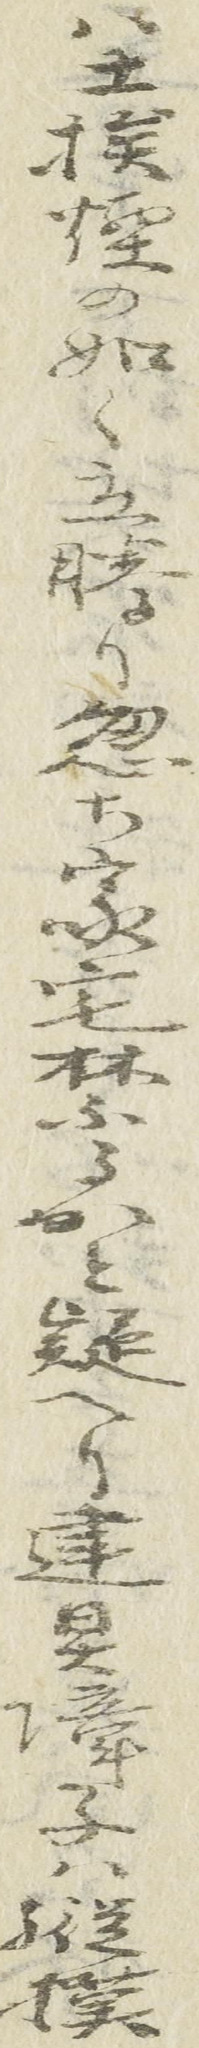は土埃煙の如く立騰り忽ち家宅焚るかと疑へり建具障子は縦横
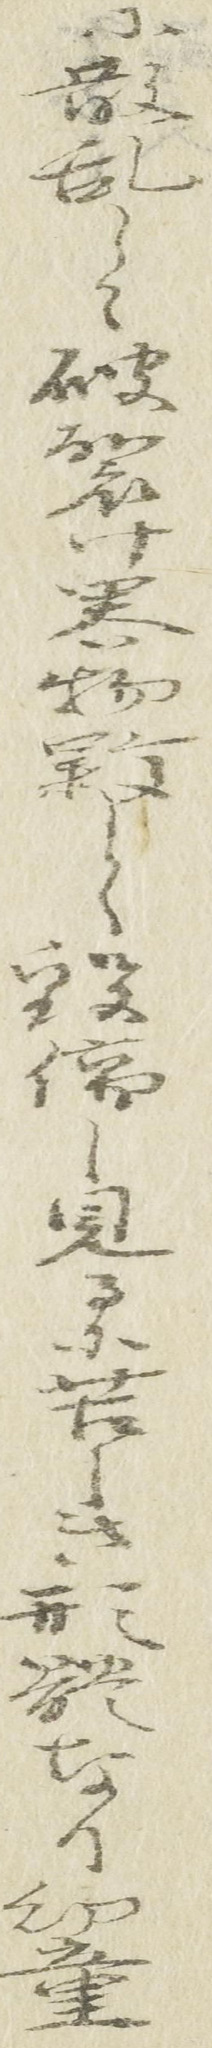に散乱して破裂け器物夥しく毀傷し見るに苦しき形体なり幼童
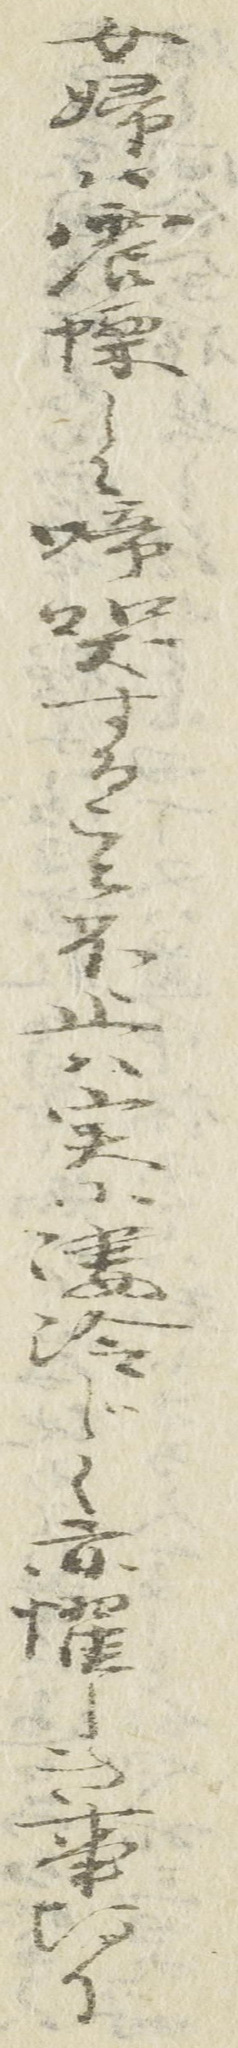女婦は震慄して啼哭すること不止は実に凄冷じく亦懼しき事なり
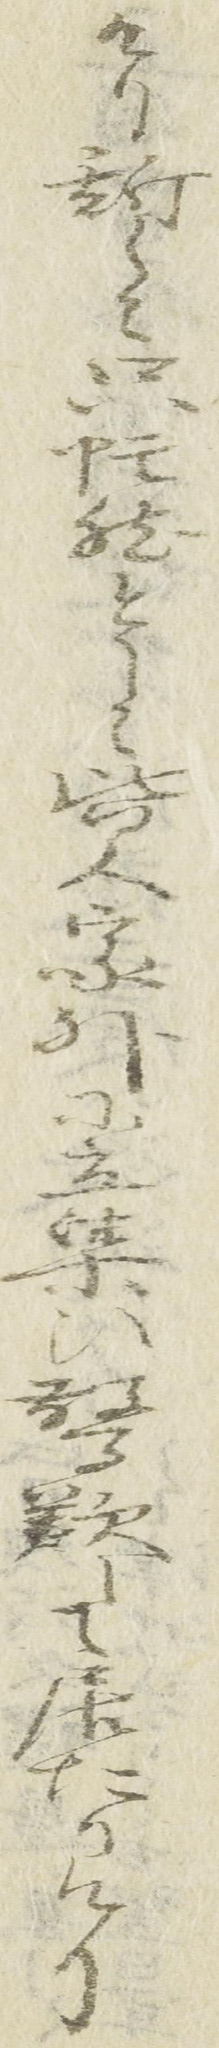けり斯くて只忙然として皆人家外に立集ひ驚歎して居たりけり
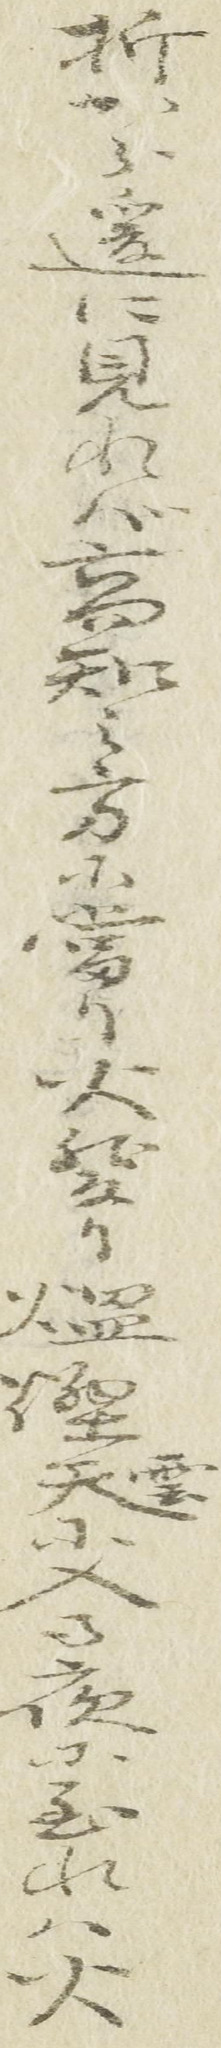折から遥に見れば高知之方に当り火登り熅煙天に入る夜に至れは火
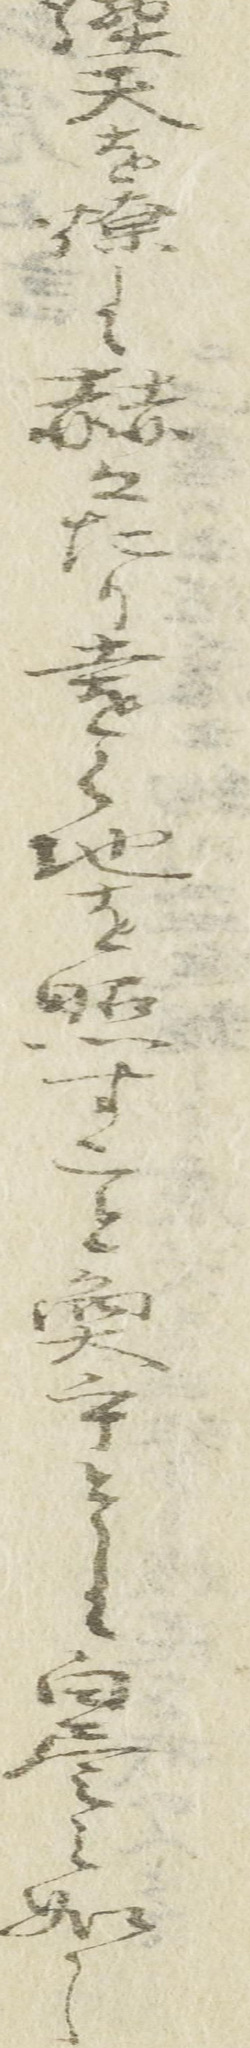煙天を燎して赫々たり遠く地を照すこと奐乎として白昼之如し
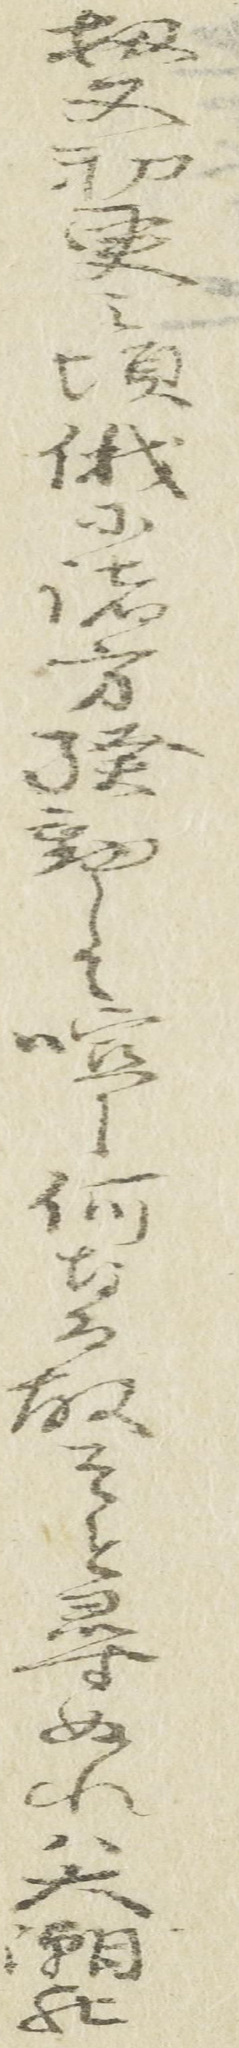扨又初更之頃俄に諸方騒動して喧し何なる故そと尋ぬれは大潮の
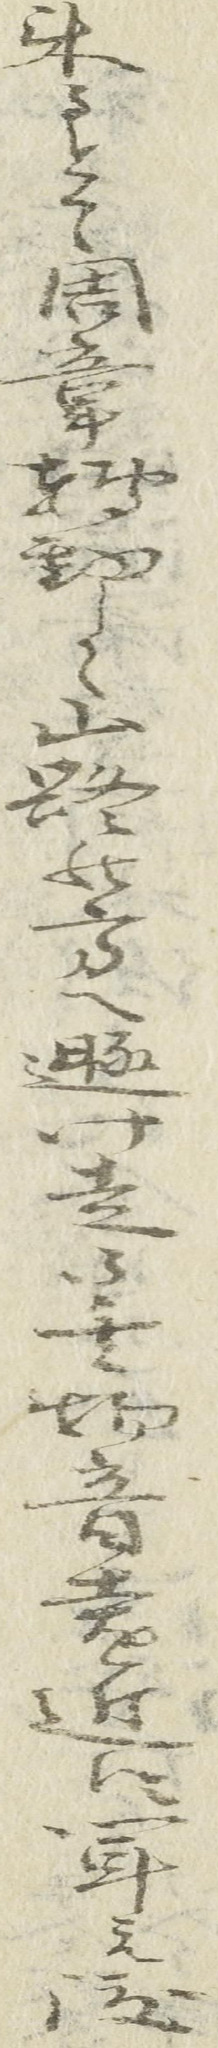来るとて周章転動して山路の方へ避け走る其物音遠近に聞え渡
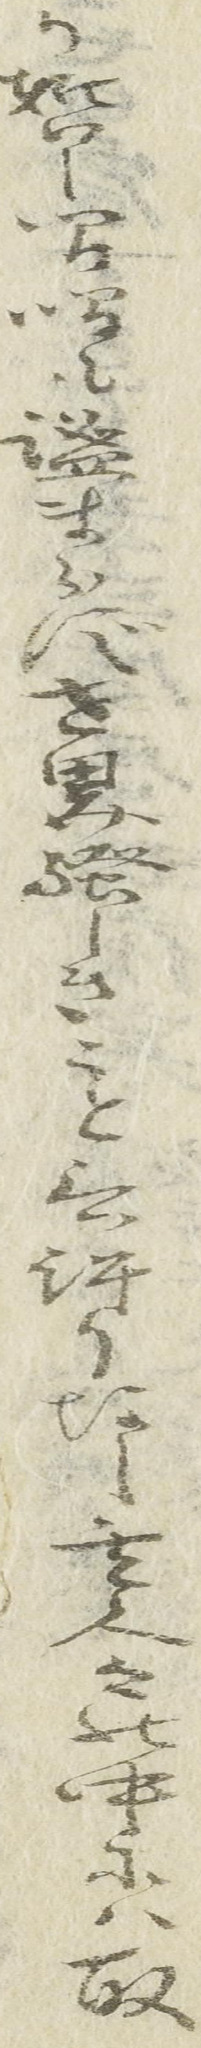り暫し間鳴も謐まらず世界騒しきこと云許りなし其人々の中には取
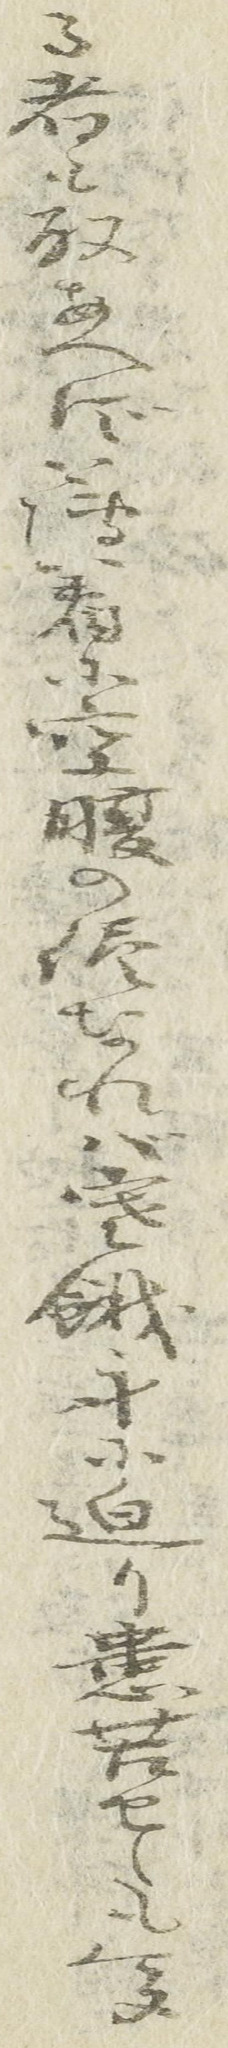る者も取あへず薄着に空腹の侭なれば寒餓身に迫り患苦せしも多
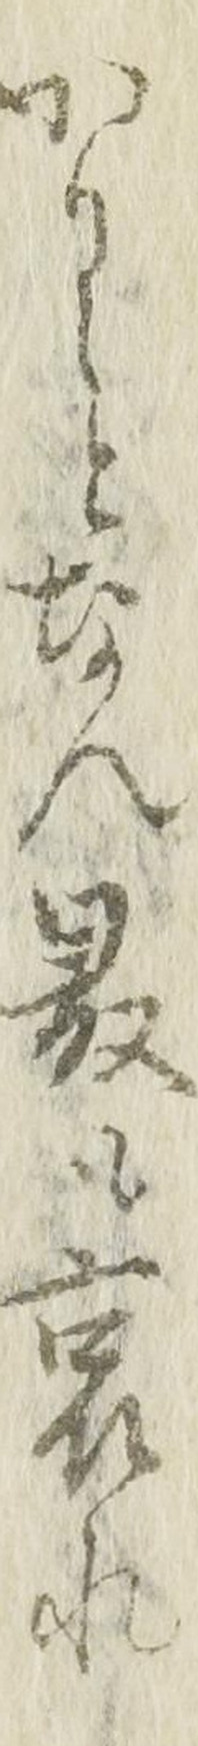かりしとなん最も哀れ
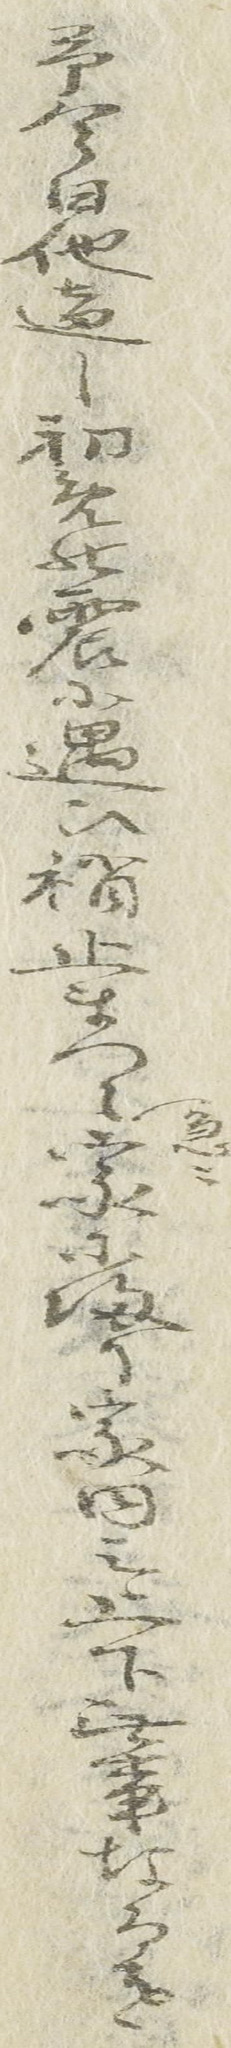予今日他適し初めの震に遇ひ稍止まつて家に帰り家内之上下無事なるを
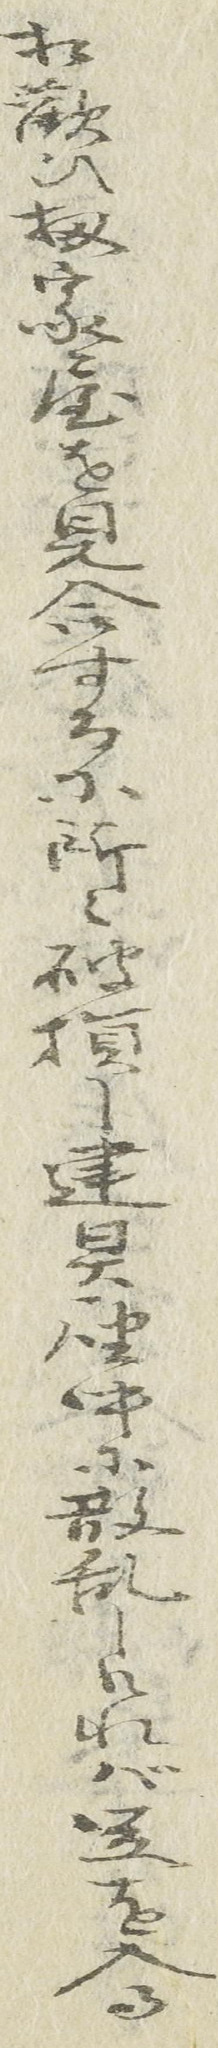相歓ひ扨家屋を見合するに所々破損し建具座中に散乱しければ足を入る
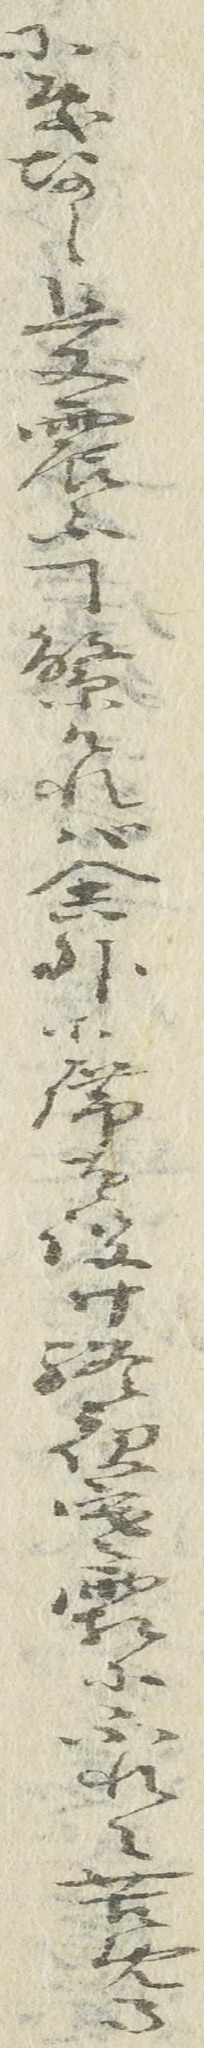に処なし旦又震ふコト繁ければ舎外に席を設け終夜寒霜にふれて苦める
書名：地震前兆集　全
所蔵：東京大学地震研究所図書室 Earthquake Research Institute Library, The University of Tokyo, JAPAN
